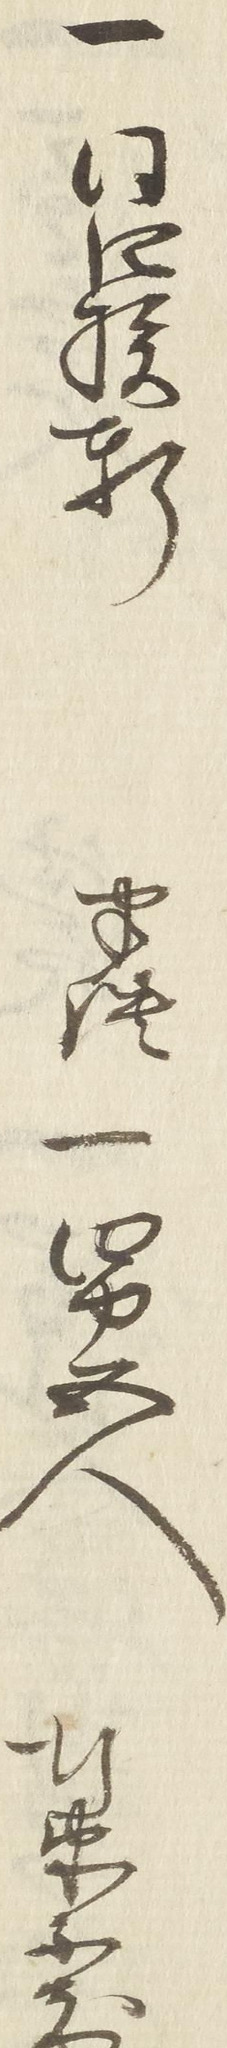一同四拾軒半潰一男五人行衛不知
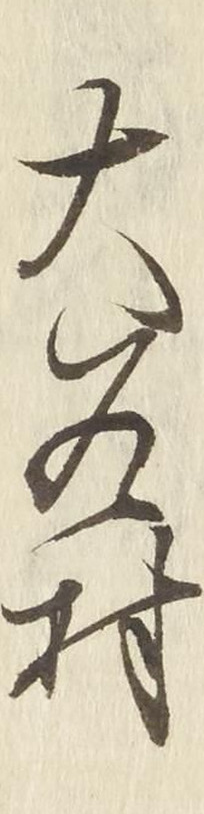大谷村
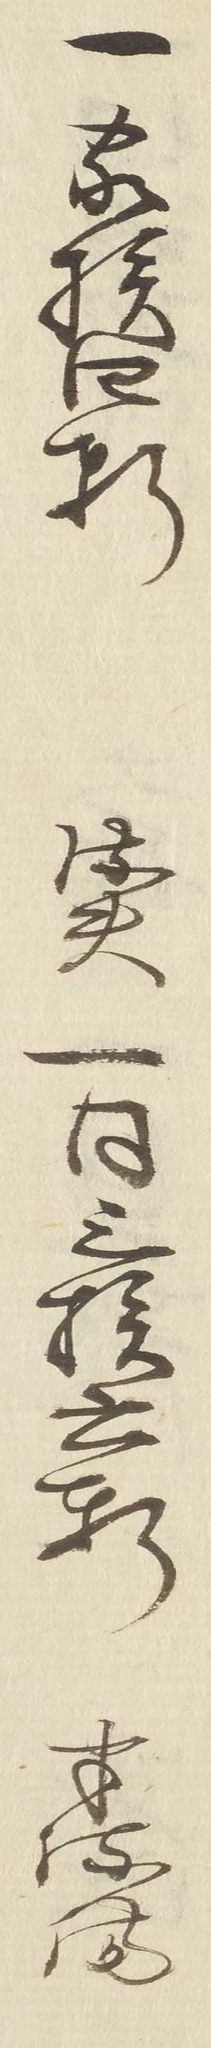一家拾四軒流失一同三拾六軒半流傷

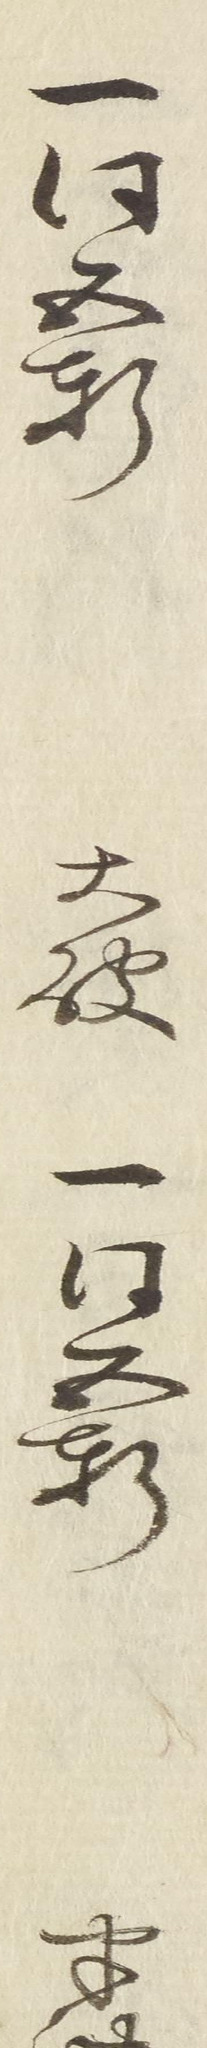一同五軒大破一同五軒半潰
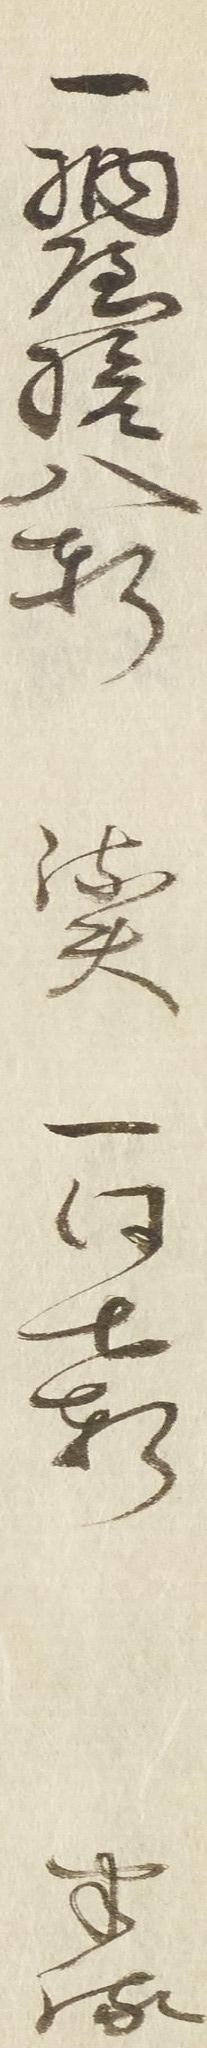一納屋拾八軒流失一同七軒半流
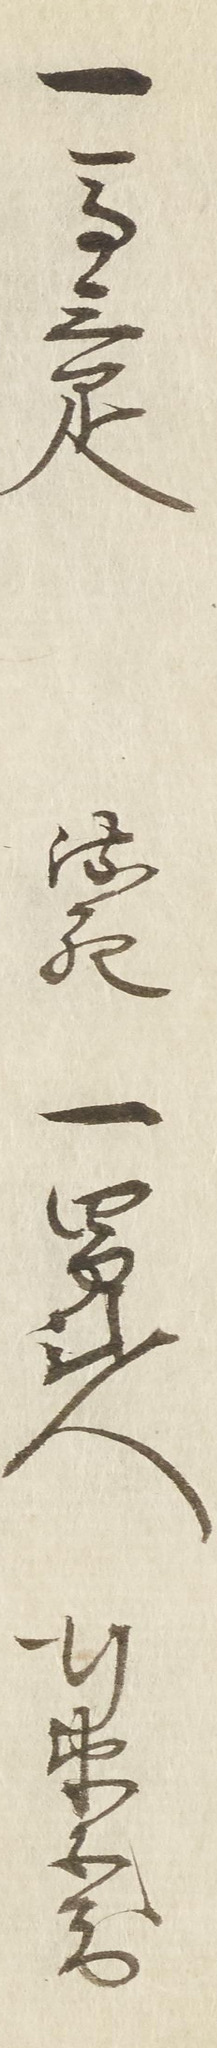一馬三疋流死一男弐人行衛不知
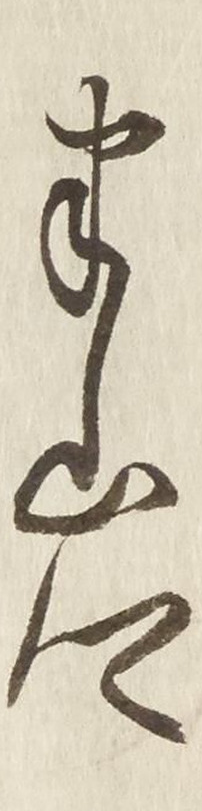半山郷
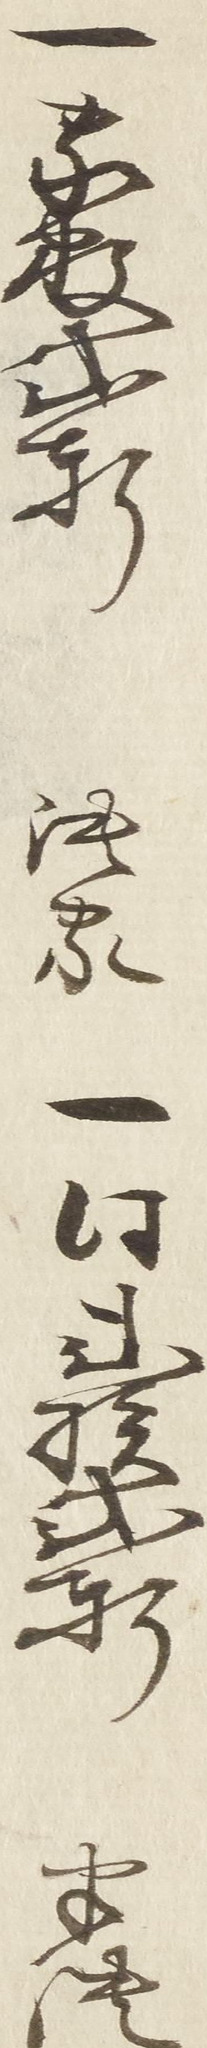一家数弐軒潰家一同弐拾弐軒半潰
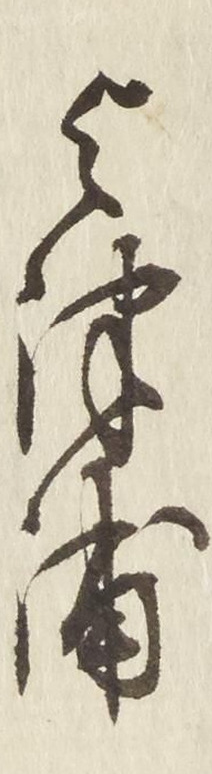与津浦
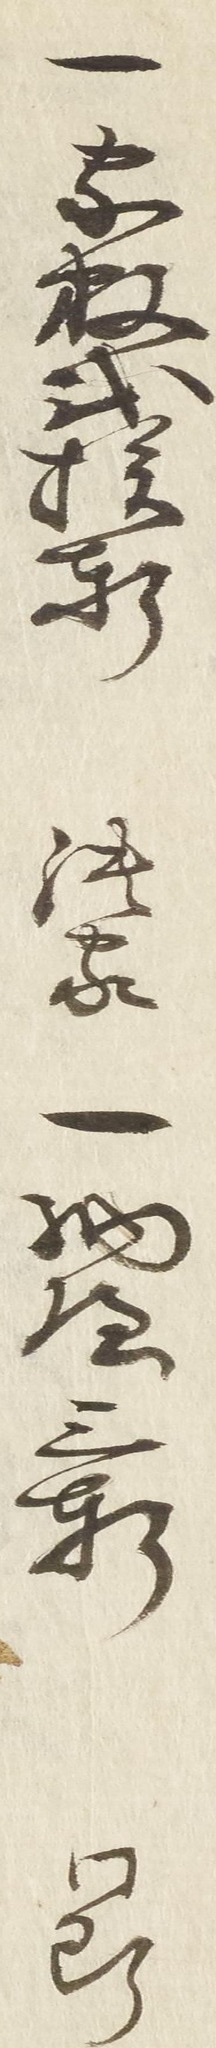一家数弐拾軒潰家一納屋三軒同断
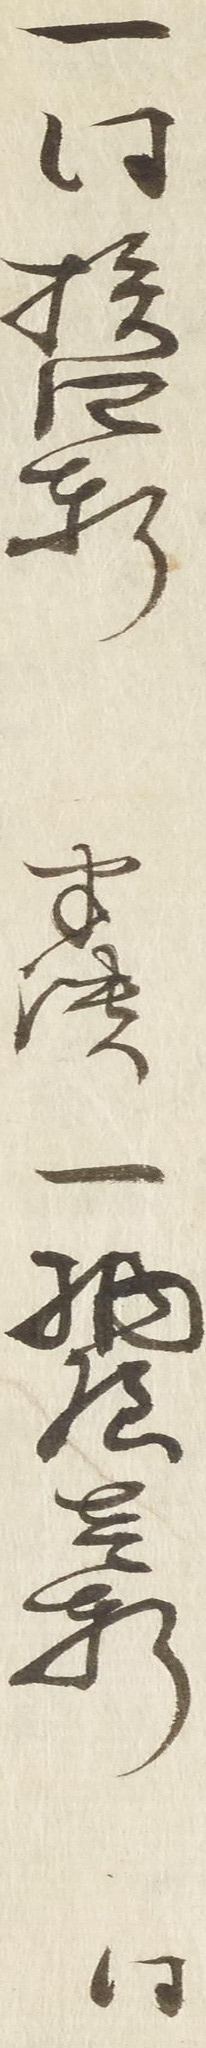一同拾四軒半潰一納屋壱軒同
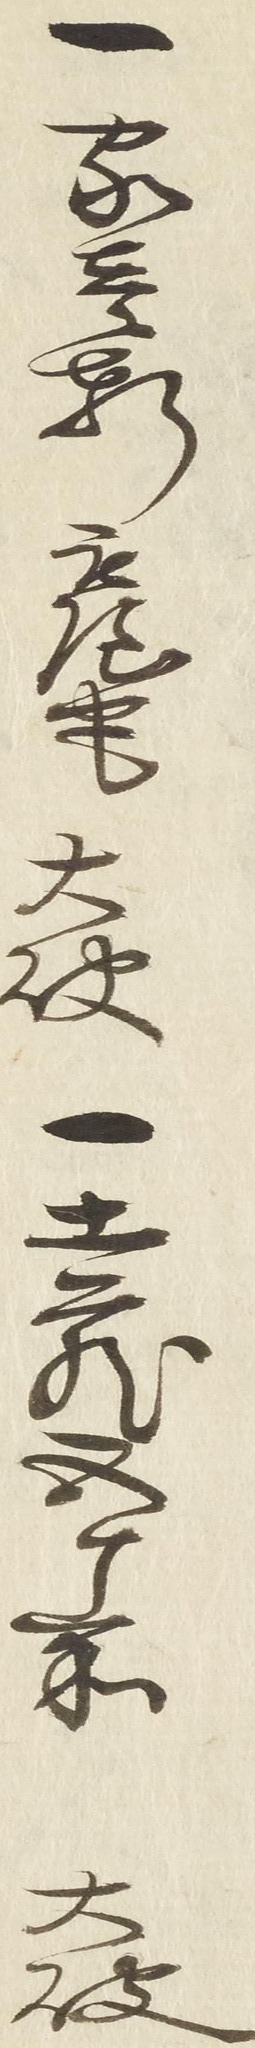一家壱軒庄屋宅大破一土蔵五ヶ所大破
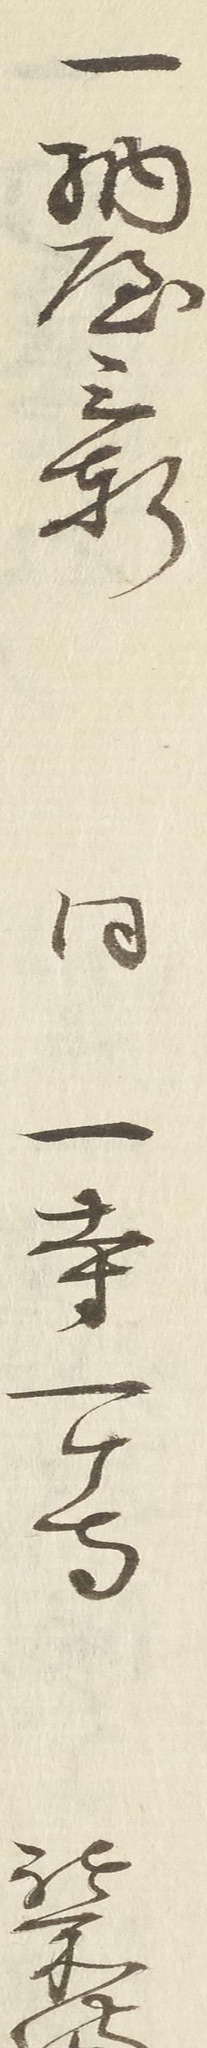一納屋三軒同一寺一ヶ寺諸所傷
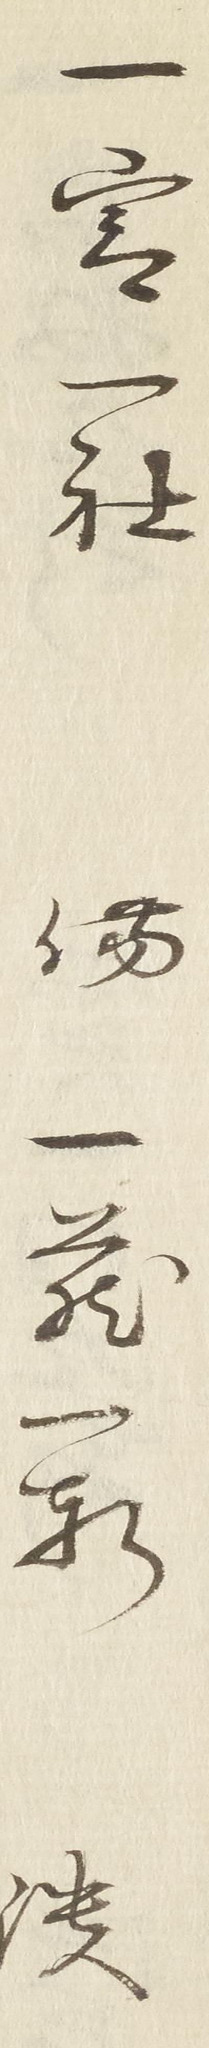一宮一社傷一蔵一軒潰
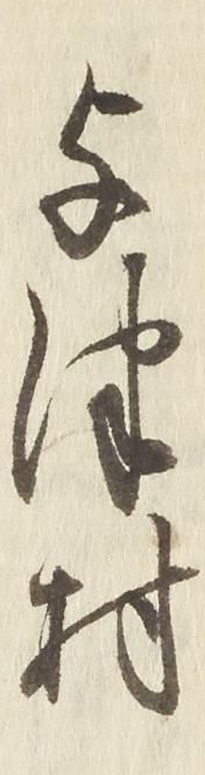与津村
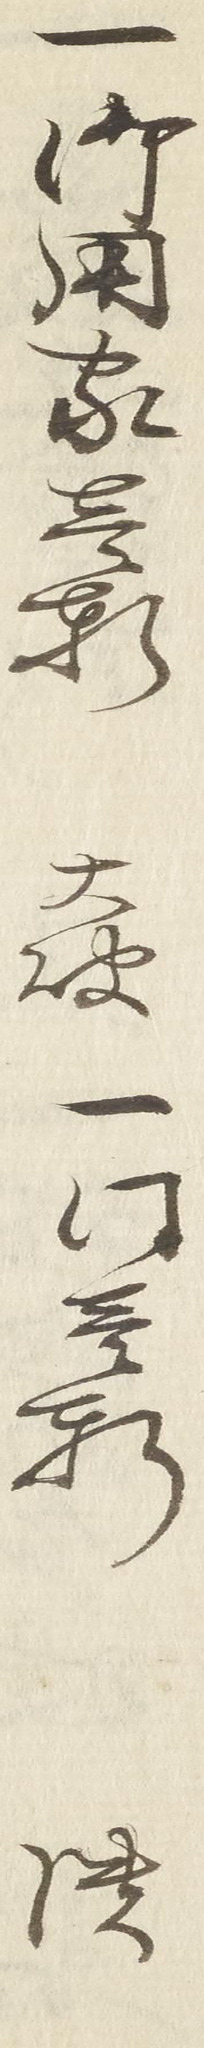一御用家壱軒大破一同壱軒潰
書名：地震記　下
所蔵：東京大学地震研究所図書室 Earthquake Research Institute Library, The University of Tokyo, JAPAN
